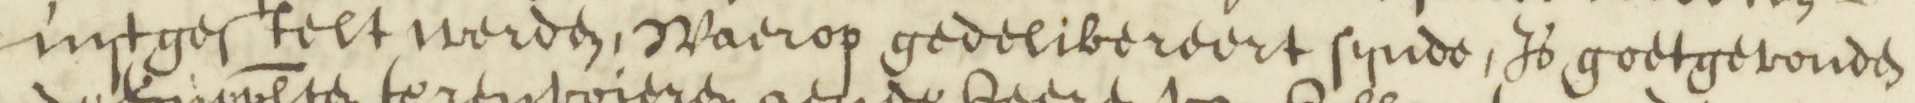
uytgestelt werden. Waerop gedelibereert synde, Is goetgevonden
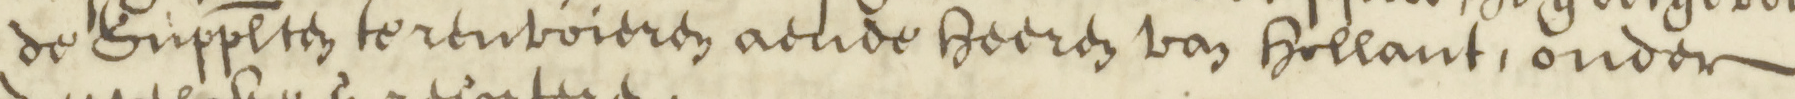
de Supplten te renvoieren aende heeren van hollant, onder
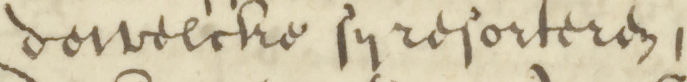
dewelcke sy resorteren.
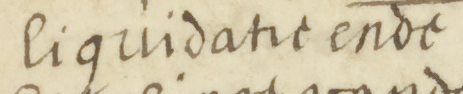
liquidatie ende
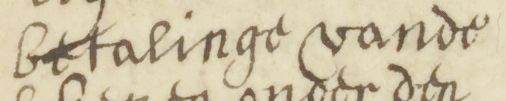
betalinge vande
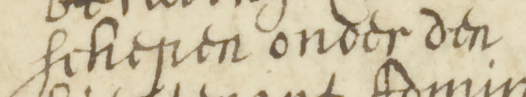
schepen onder den
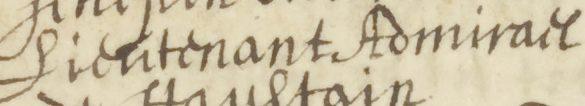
Lieutenant Admirael
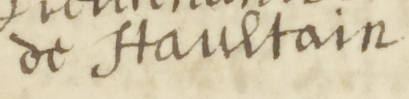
de Haultain
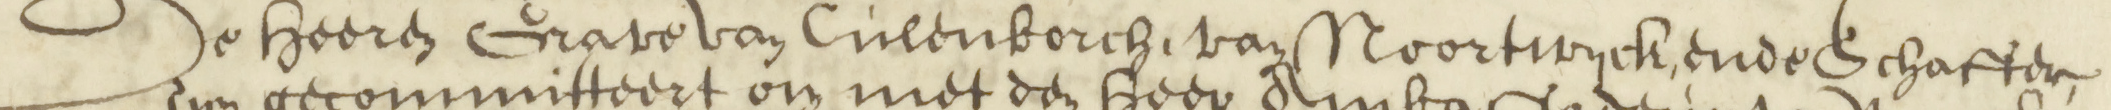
De heeren Grave van Culenborch, van Noortwyck ende Schaffer,
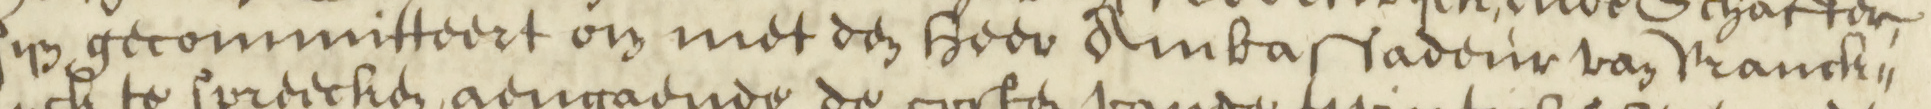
syn gecommitteert om met den heer Ambassadeur van Vranck„
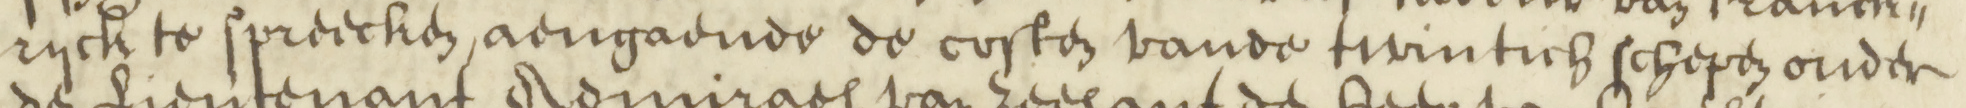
ryck te spreecken, aengaende de costen vande twintich schepen onder
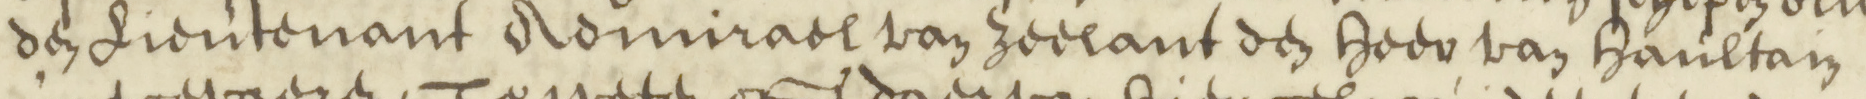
den Lieutenant Admirael van Zeelant den heer van Haultain
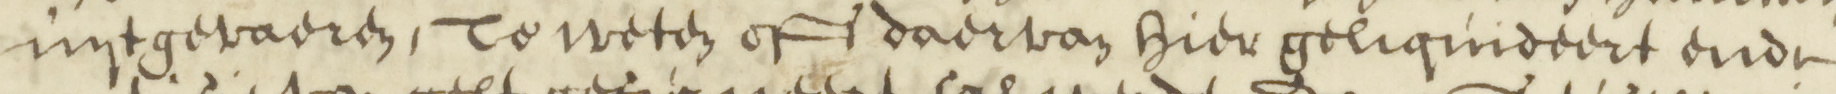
uytgevaeren, Te weten off daervan hier geliquideert ende
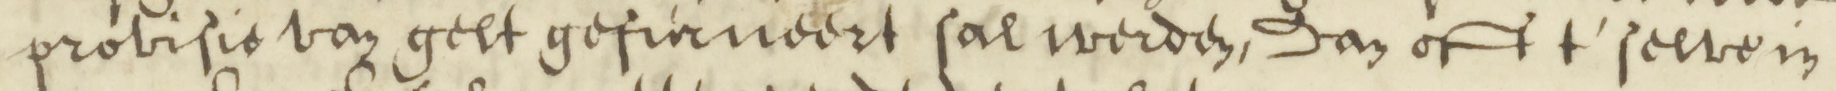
provisie van gelt gefurneert sal werden, Dan off t'selve in
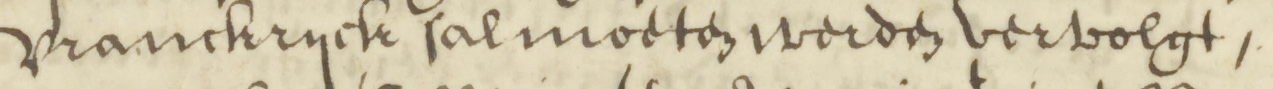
Vranckryck sal moeten werden vervolgt.
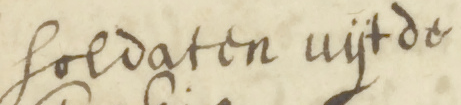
soldaten uijt de
